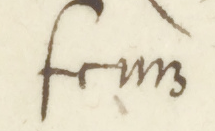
fcum
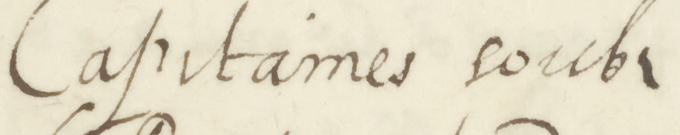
Capitaines soubz
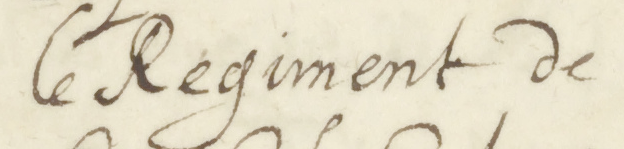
le Regiment de
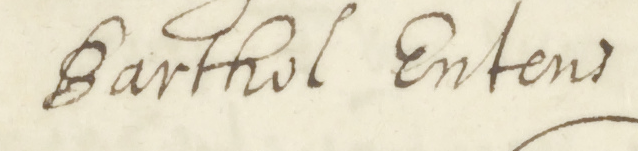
Barthol Entens
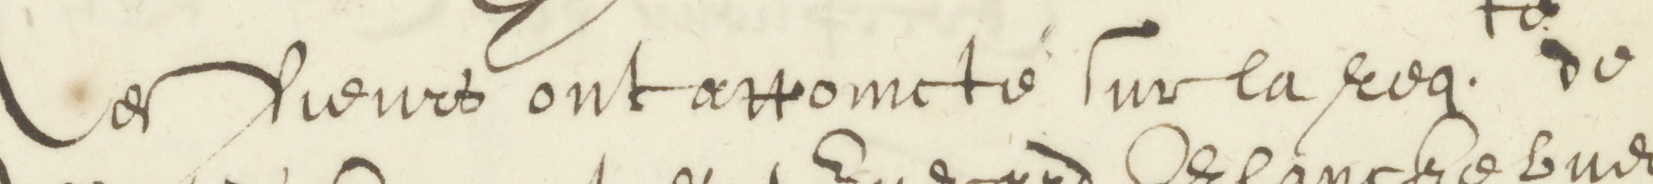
Messieurs ont appoincté sur la reqte de
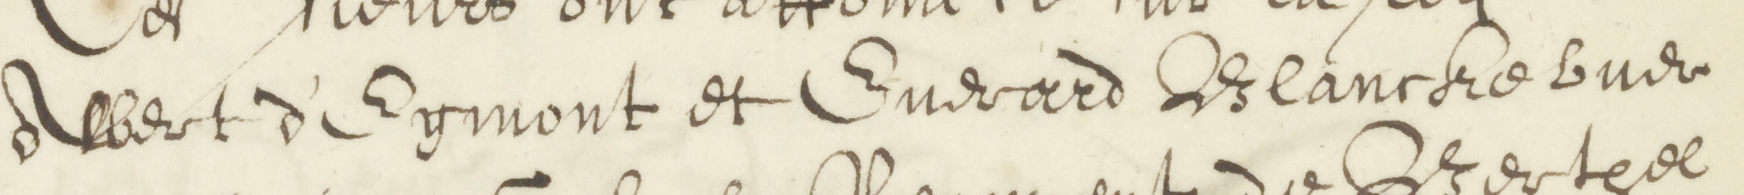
Albert d'Egmont et Everard Blanckebuer
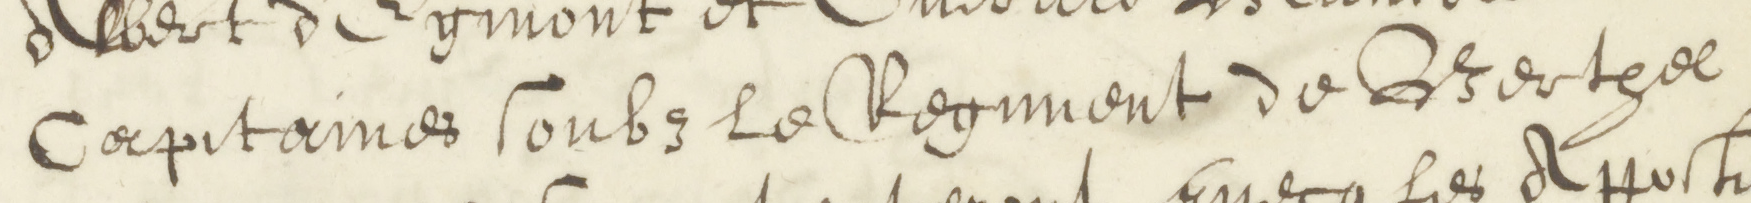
capitaines soubz le Regiment de Berthel
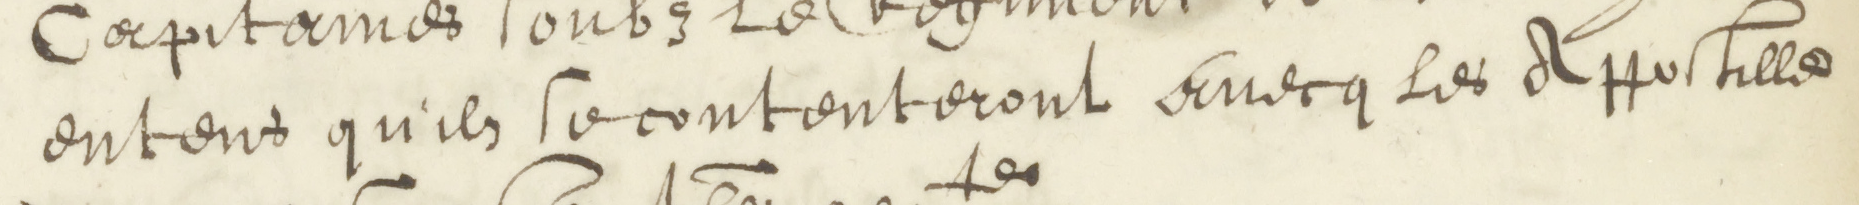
entens qu'ils se contenteront avecq les Appostilles
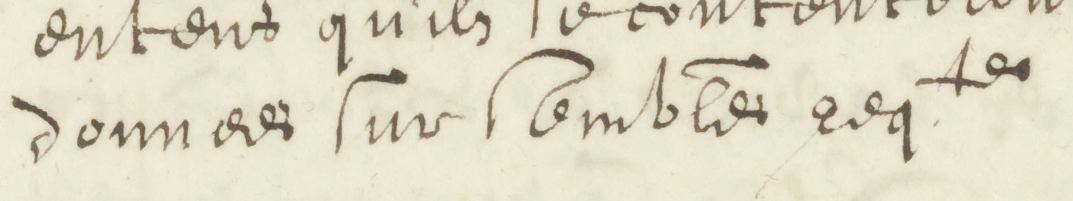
donnees sur sembles reqtes.
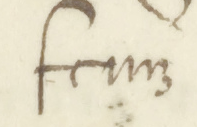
fcum
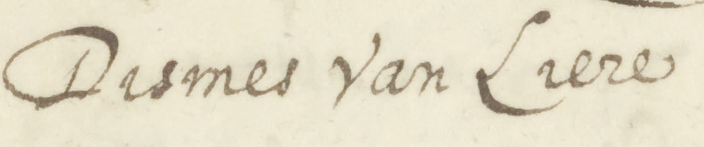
Dismes van Liere
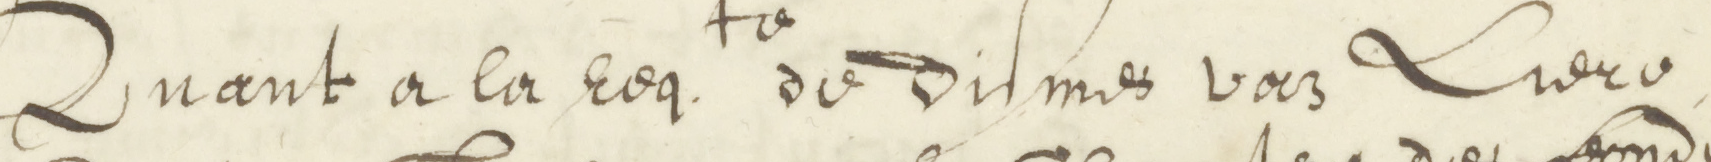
Quant a la reqte de Dismes van Liere
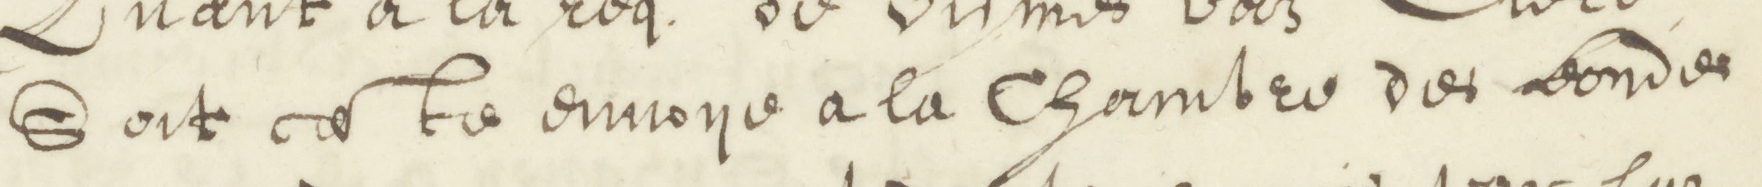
Soit ceste envoye a la Chambre des Aydes
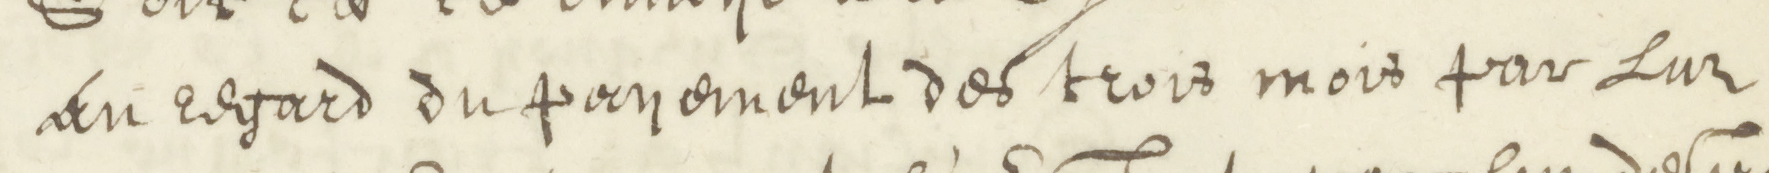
au regard du payement des trois mois par luy
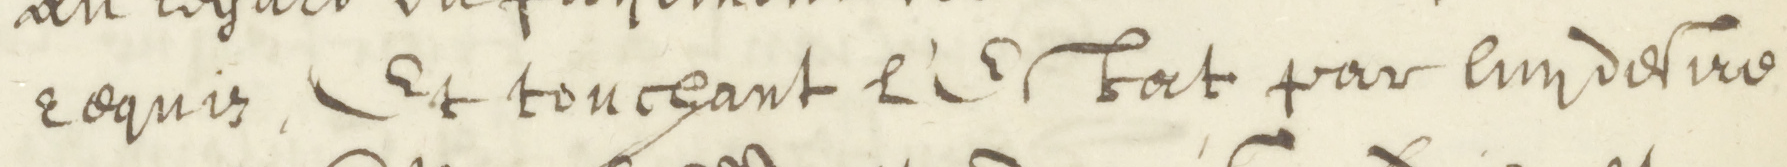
requiz. Et touchant l'Estat par luy desiré
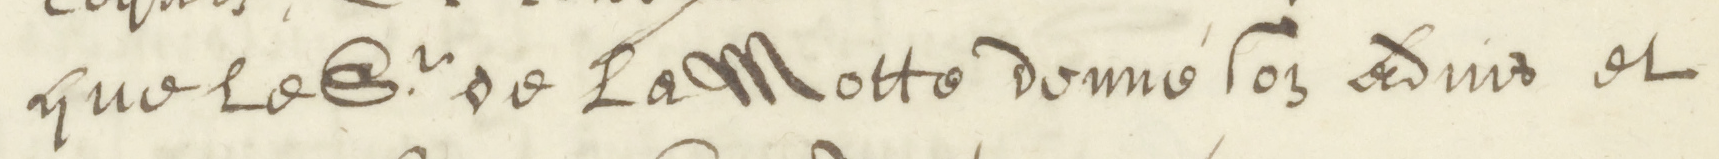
que le Sr de la Motte donne son aduis et
